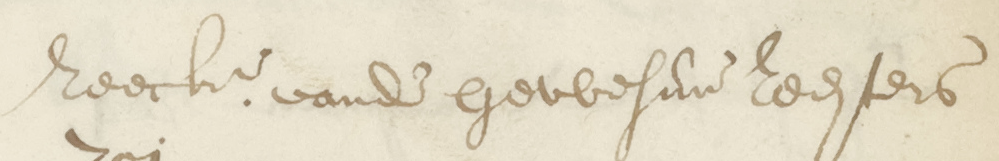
reecke. vande gewesene rechters
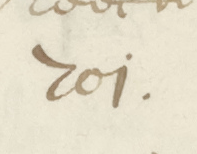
701.
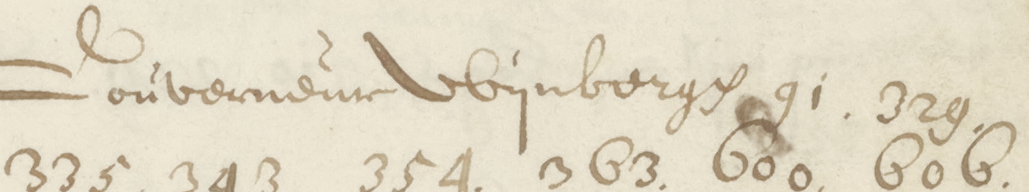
Gouverneur Wijnbergh 91, 329,
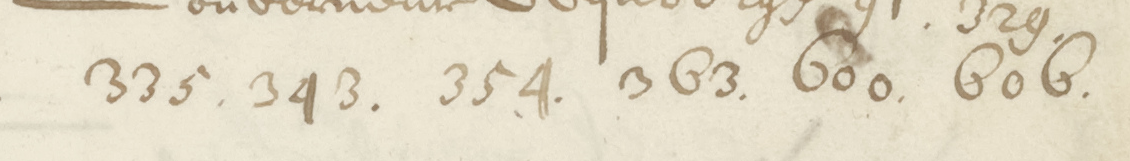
335, 343, 354, 363, 600, 606.
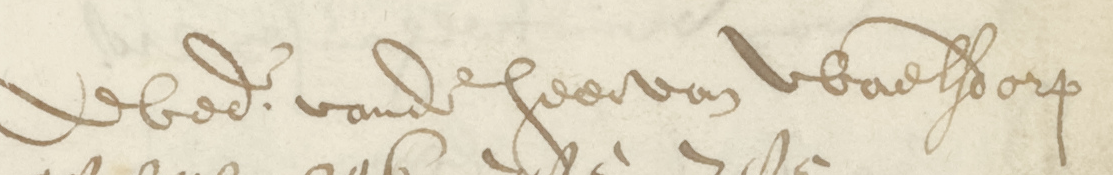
Wede. vande heer van Waelsdorp
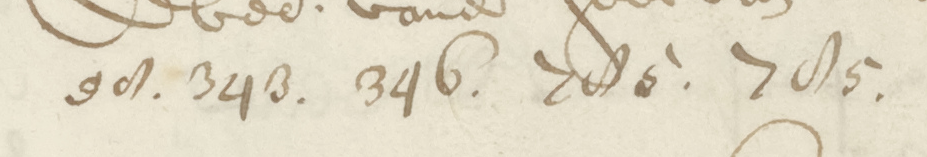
98, 343, 346, 785, 785.
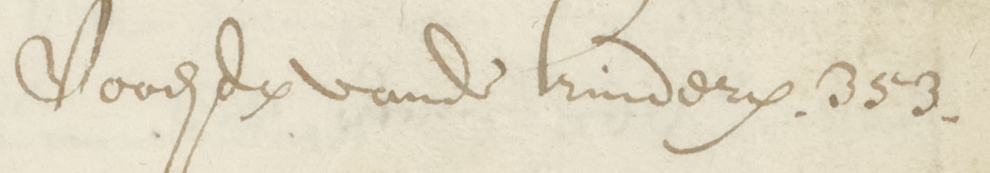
Voochden vande kinderen, 353.
